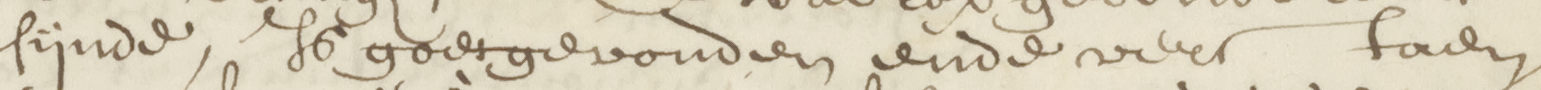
sijnde, Is goetgevonden ende verstaen,
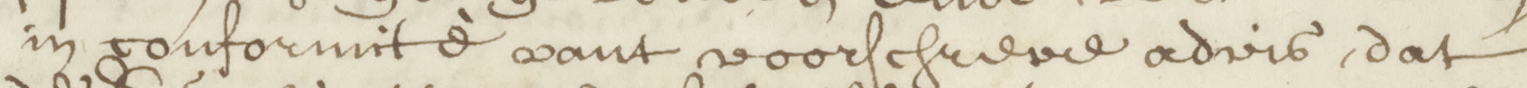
in conformitè vant voorschreve advis, dat
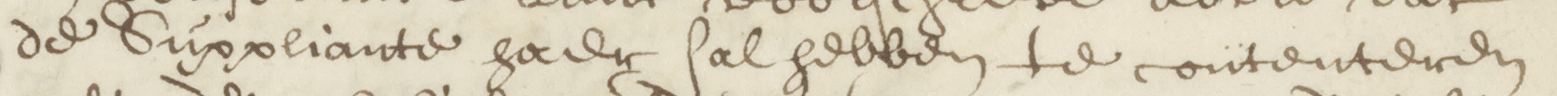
de Suppliante haer sal hebben te contenteren
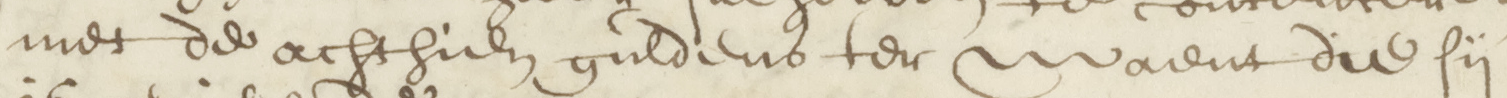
met de achthien guldens ter Maent die sij
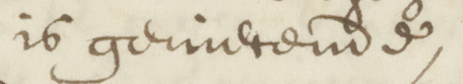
is genietende.
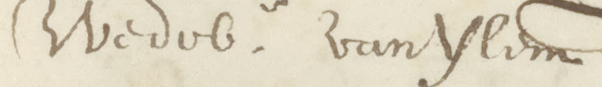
Wedwe. van Ylem
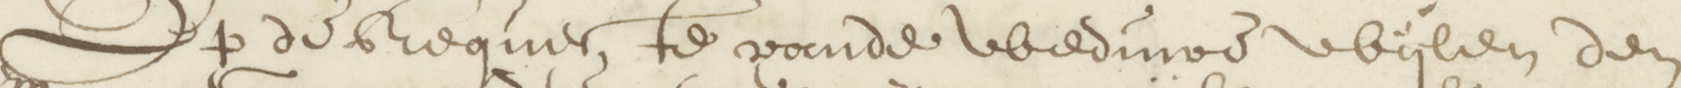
Op de Requeste vande weduwe wijlen den
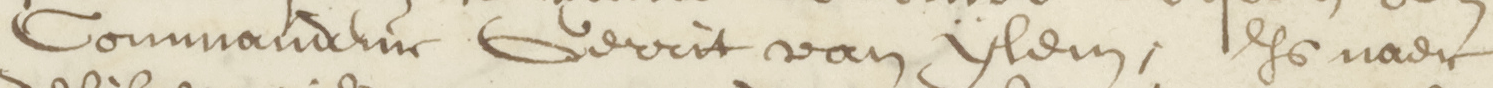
Commandeur Gerrit van IJlem, Is naer
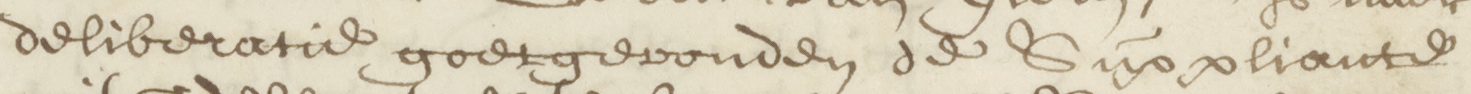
deliberatie goetgevonden de Suppliante
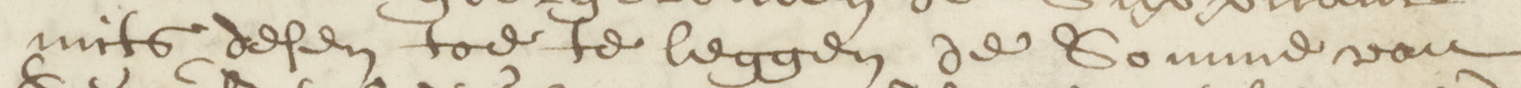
mits desen toe te leggen de Somme van
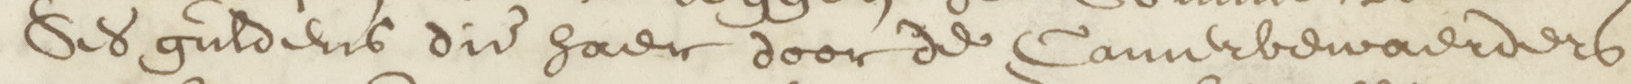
Ses guldens die haer door de Camerbewaerders
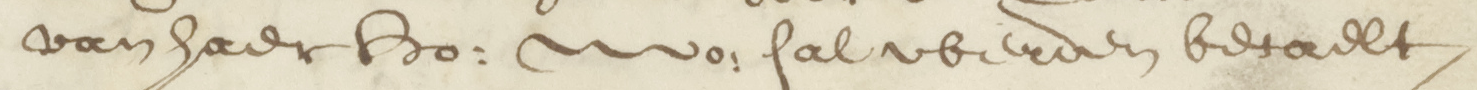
van haer Ho:Mo: sal werden betaelt.
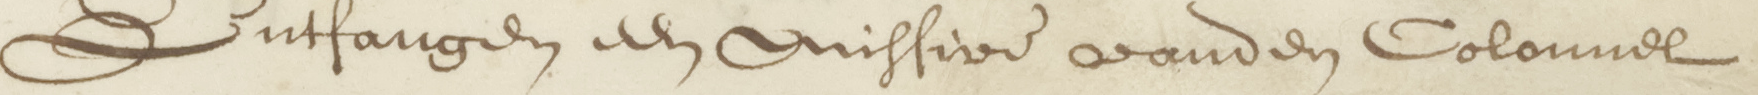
Ontfangen een Missive vanden Colonnel
